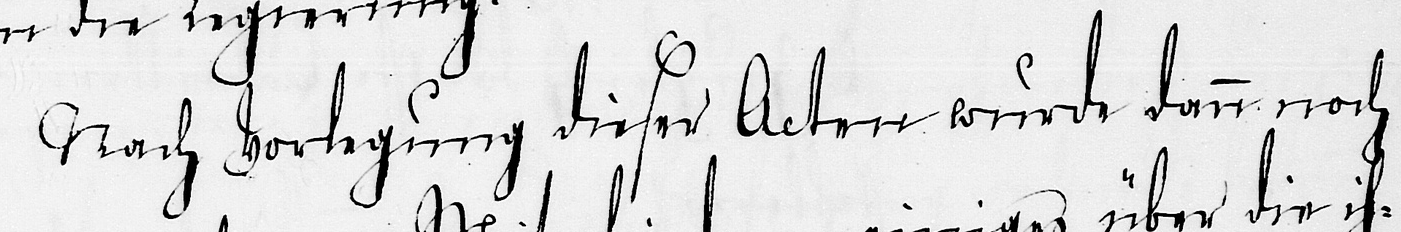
Nach Vorlegung dieser Acten wurde dann noch
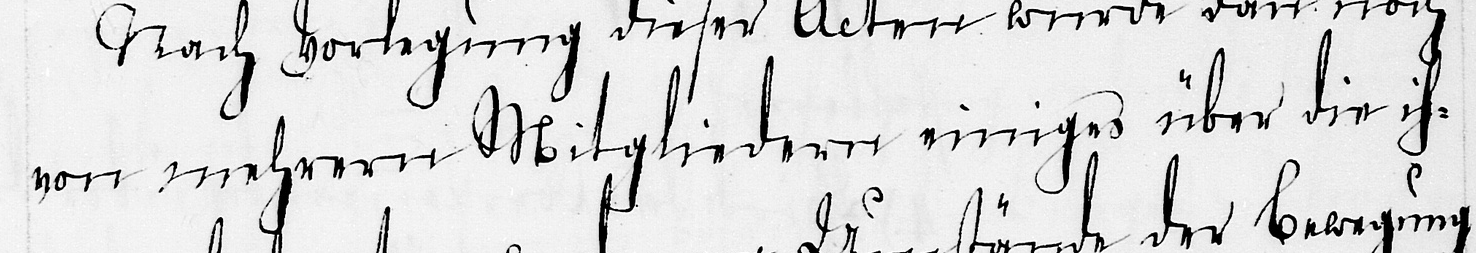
von mehrern Mitgliedern einiges über die ih¬
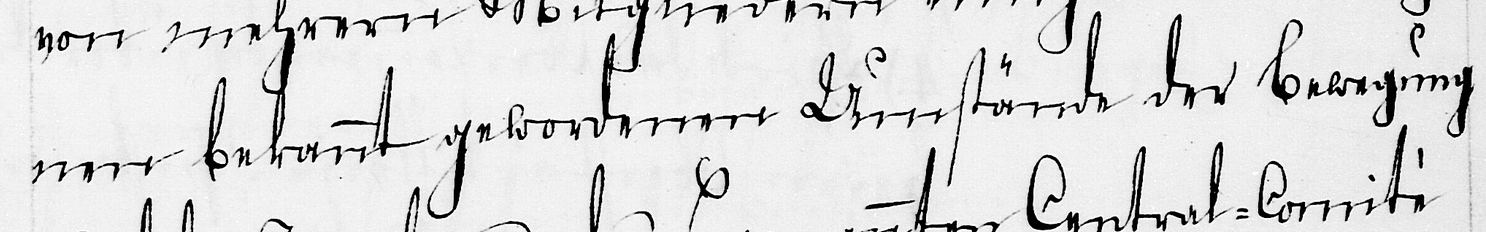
nen bekannt gewordenen Umstände der Bewegung
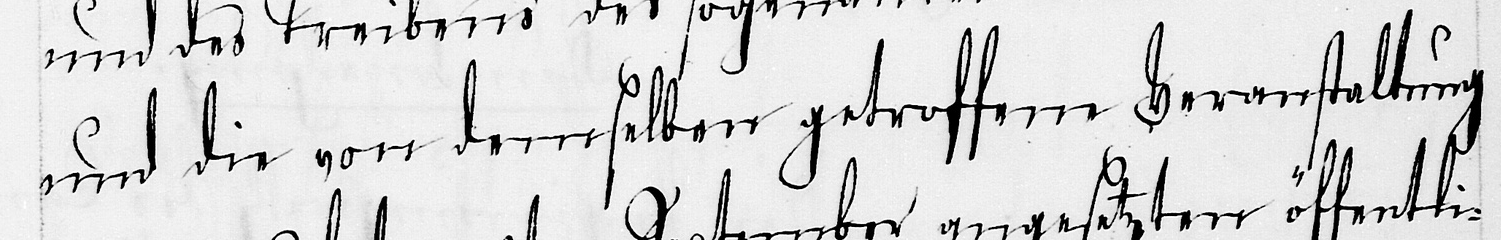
und die von demselben getroffene Veranstaltung
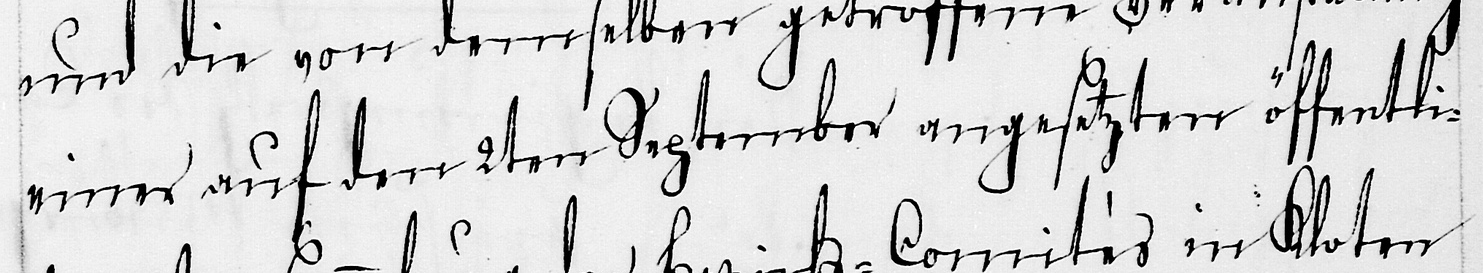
einer auf den 2ten September angesetzten öffentli¬
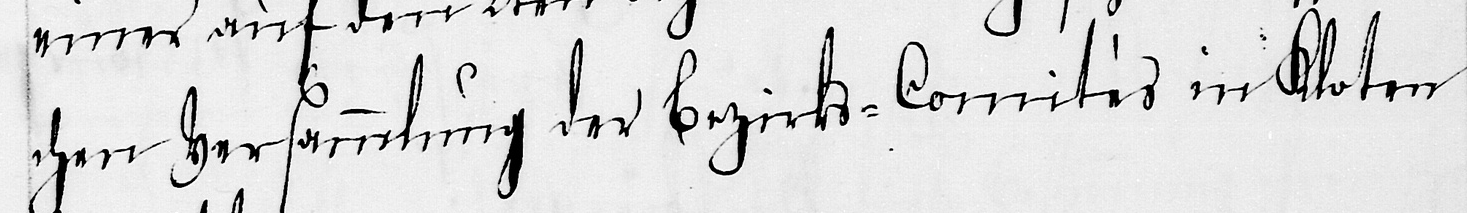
chen Versammlung der Bezirks-Comités in Kloten
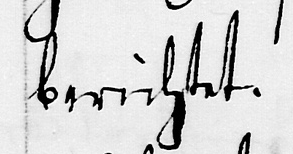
berichtet.
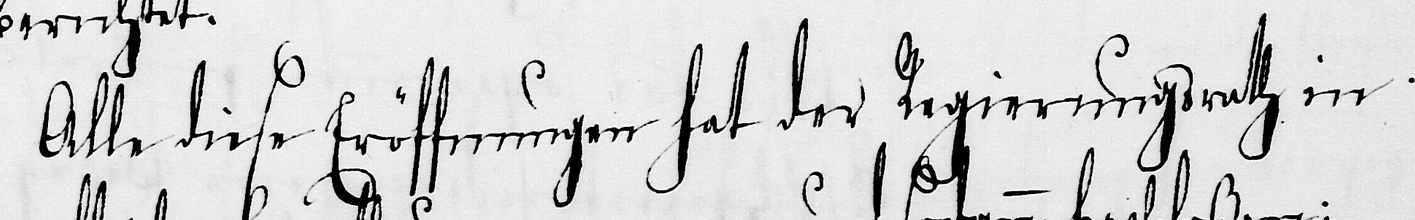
Alle diese Eröffnungen hat der Regierungsrath in
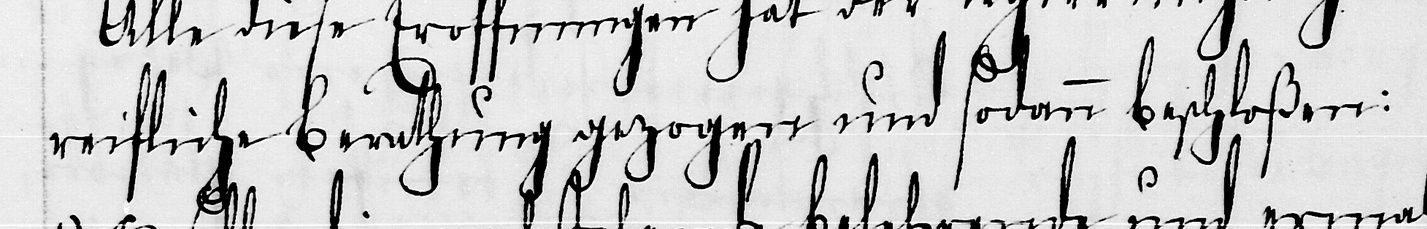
reifliche Berathung gezogen und sodann beschloßen:
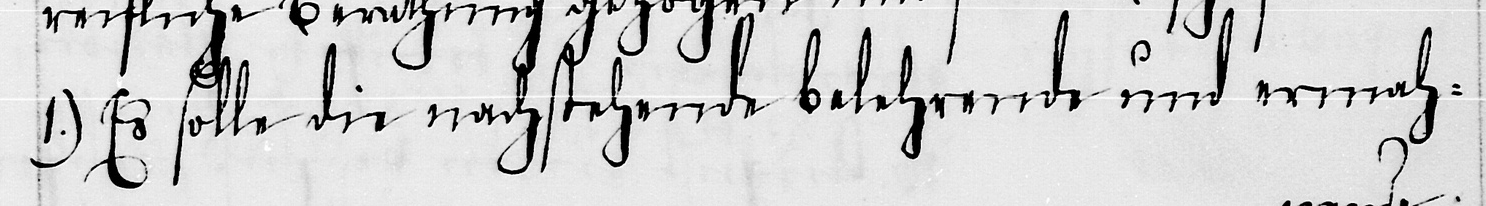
1.) Es solle die nachstehende belehrende und ermah-
